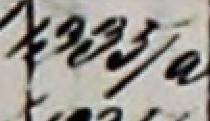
1335/a
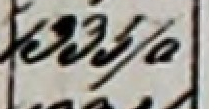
1335/a
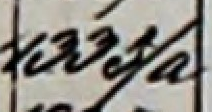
1335/a
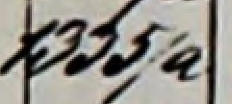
1335/a
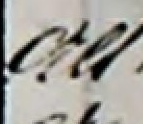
Alt
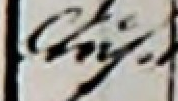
Aus„
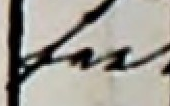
see
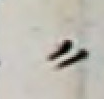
„
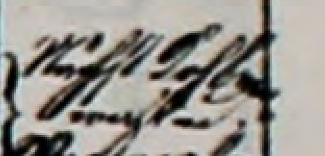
Nächst Kohlen
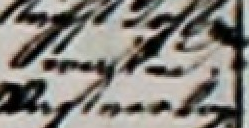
nach u.
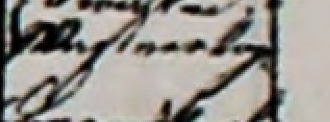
???
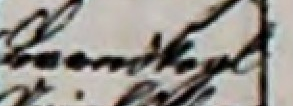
Brandkogl
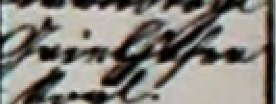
Grieshofen
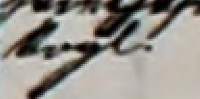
kogl
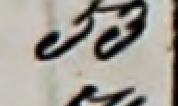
53
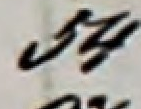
54
